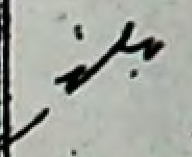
do
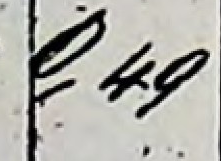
0,49
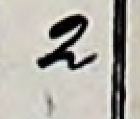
2
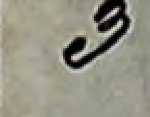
3
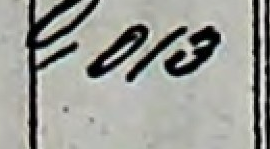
0,013
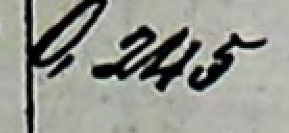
0,245
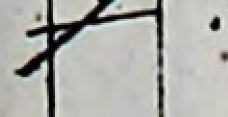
7
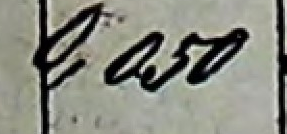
0,050
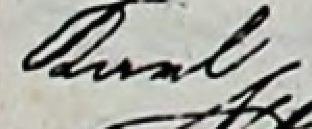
Karl
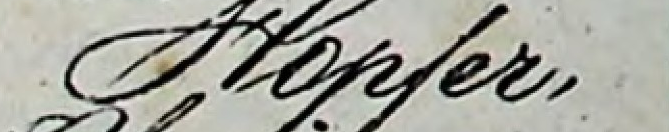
Hopfer
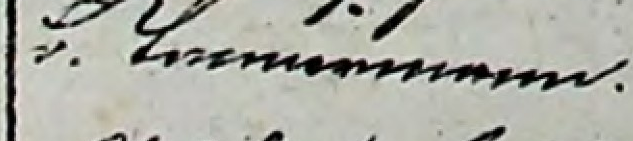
v. Tremirmann
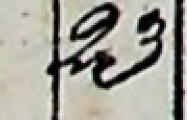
23
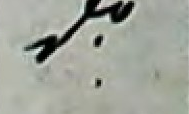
do
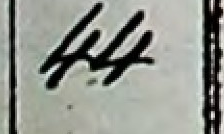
44
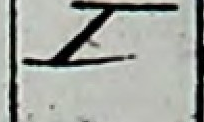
I
